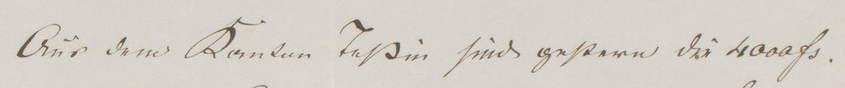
Aus dem Kanton Teßin sind gestern die 4000fs.
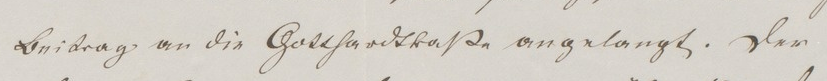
Beitrag an die Gotthardtkaße angelangt. Der
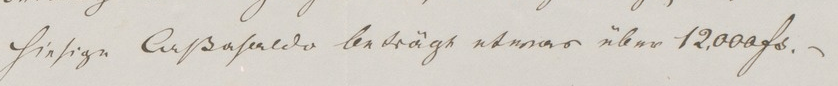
hiesige Cassasaldo beträgt etwas über 12.000fs. –
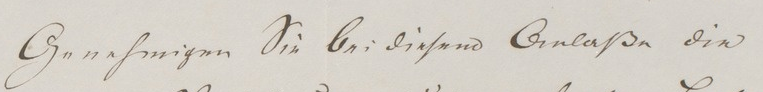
Genehmigen Sie bei diesem Anlaße die
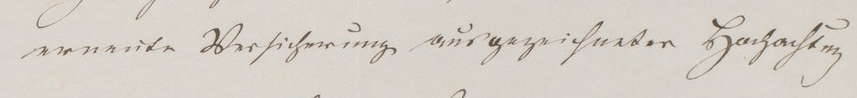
erneute Versicherung ausgezeichneter Hochachtung
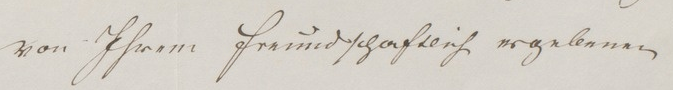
von Ihrem freundschaftlich ergebenen
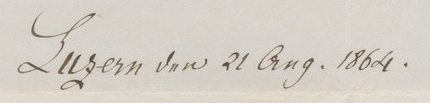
Luzern den 21 Aug. 1864.
